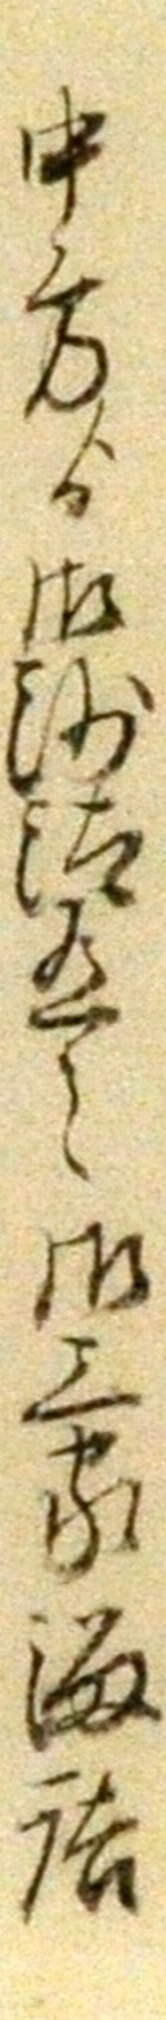中方ゟ御沙汰有之御三家溜詰
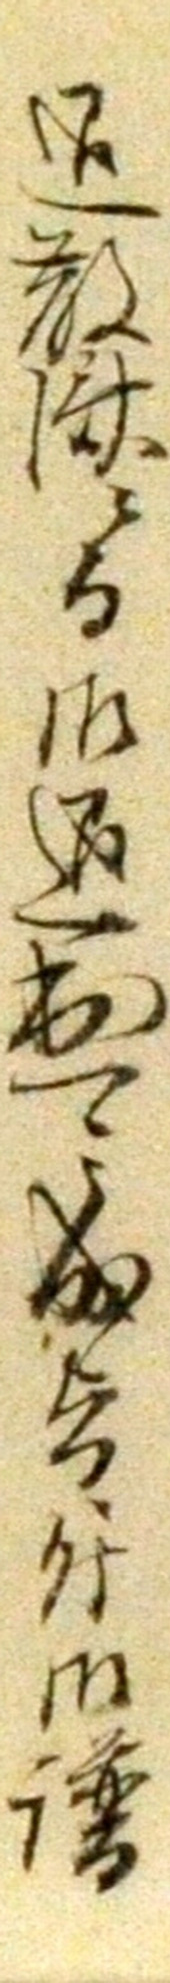退散済ニ而御退出可被成旨ニ付御譜

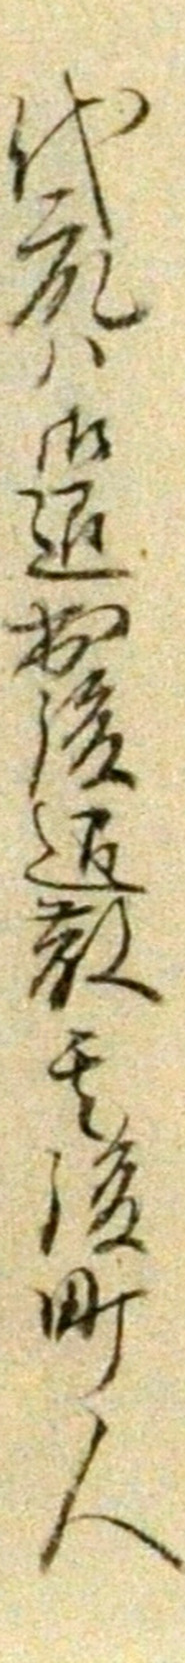代衆ハ御退出後退散其後町人
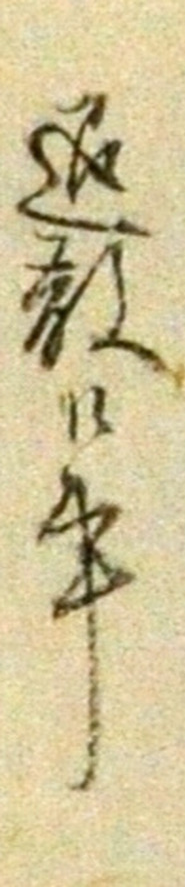退散候事
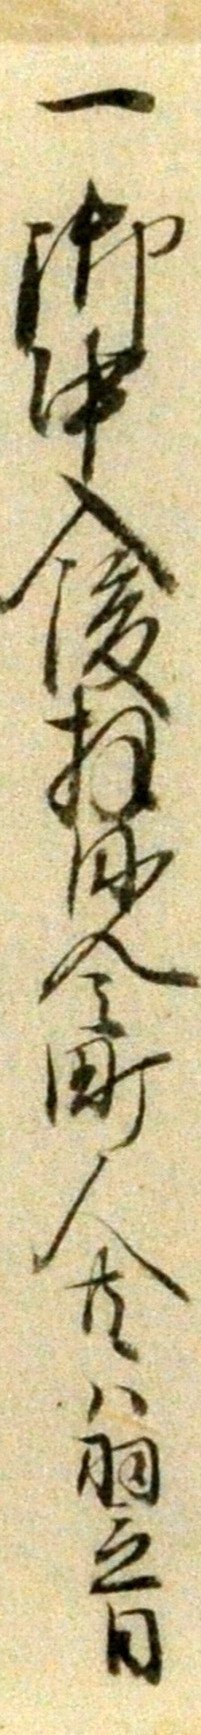一御中入後拝見之町人共ハ翌日
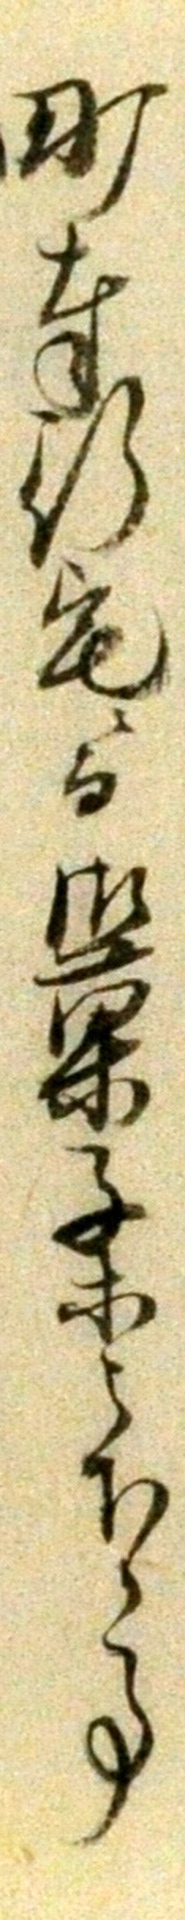町奉行宅ニ而御菓子等被下候事
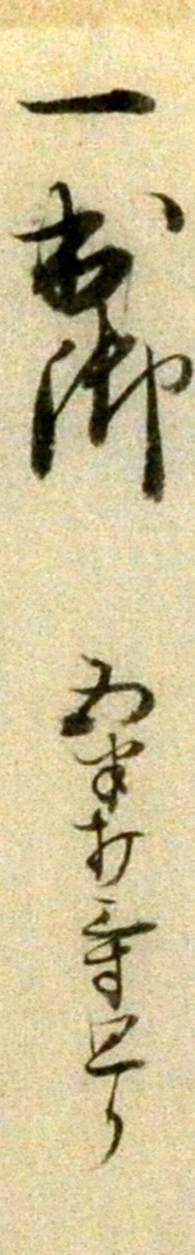一出御五半打三寸廻り
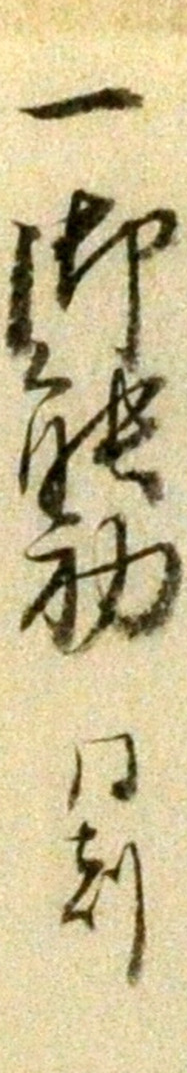一御能初同刻
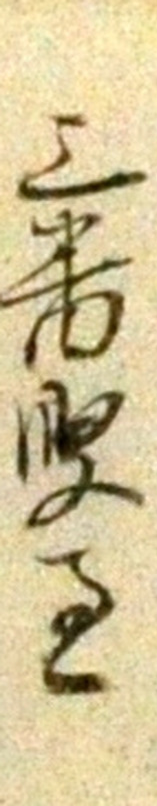三番叟過
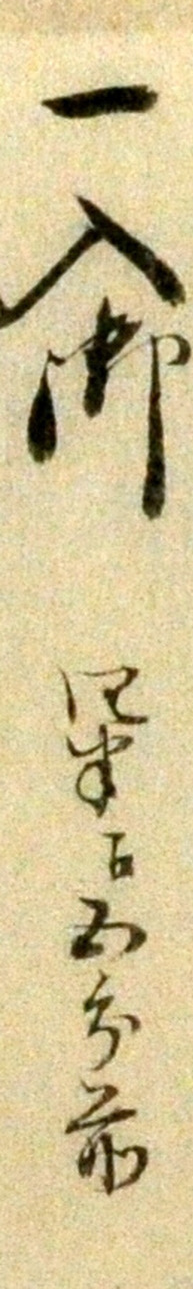一入御四半え五分前
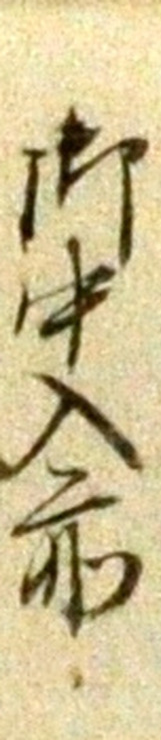御中入前
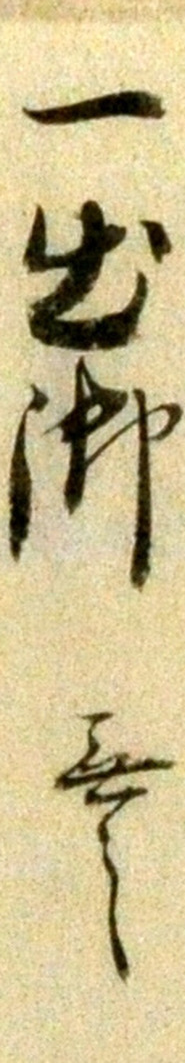一出御無之
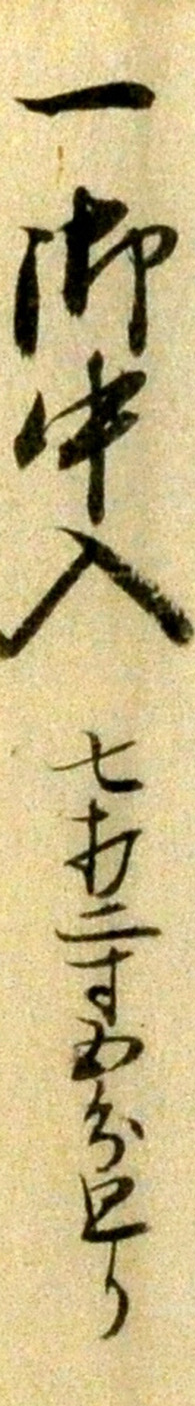一御中入七打二寸五分廻り
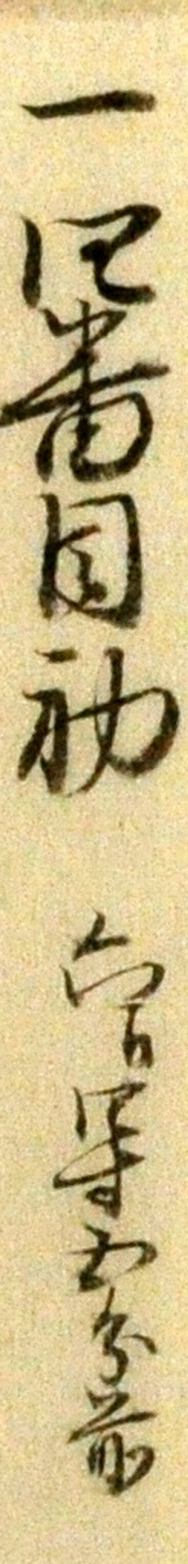一四番目初六え四寸五分前
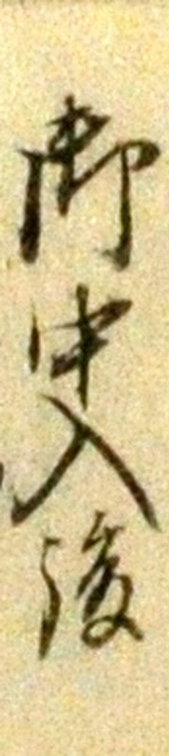御中入後
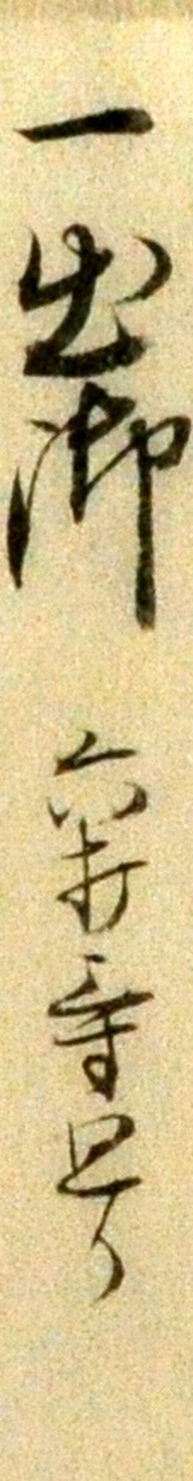一出御六打三寸廻り
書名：御馳走御能ノ節ノ留外
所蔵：伊那市立高遠町図書館・合同会社AMANE
